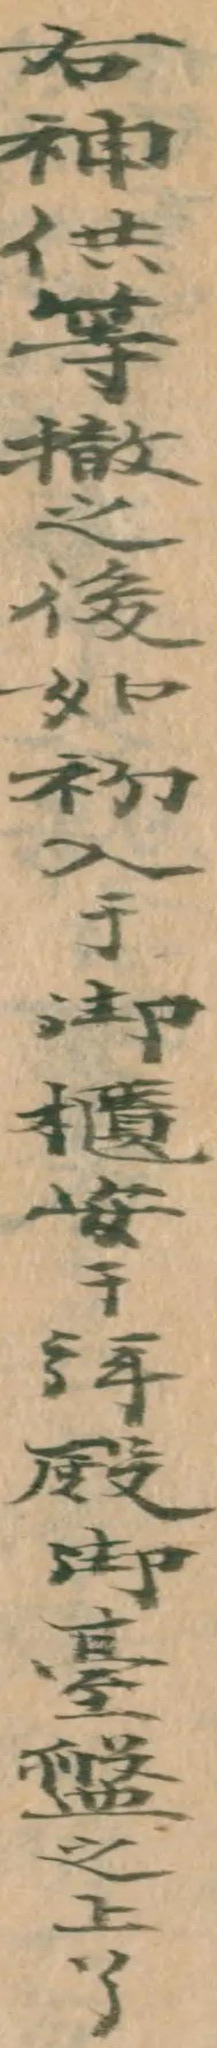右神供等撤之後如初入于御櫃安于拝殿御台盤之上了
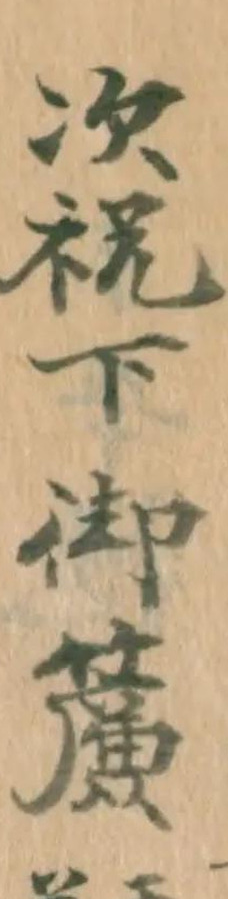次祝巻御簾
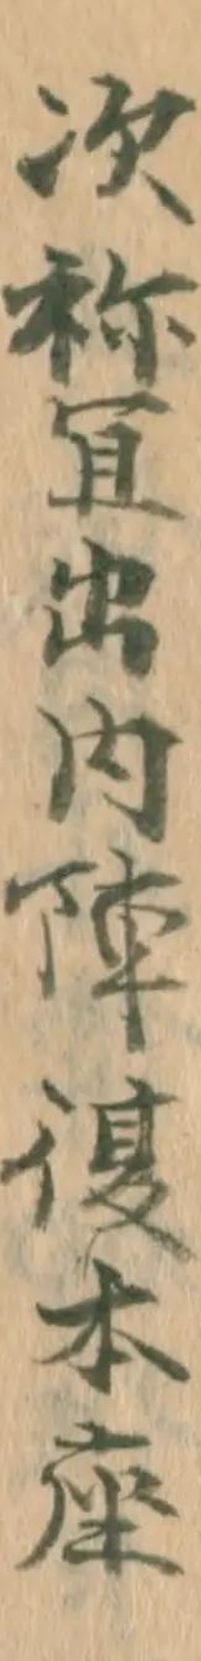次禰宜出内陣復本座

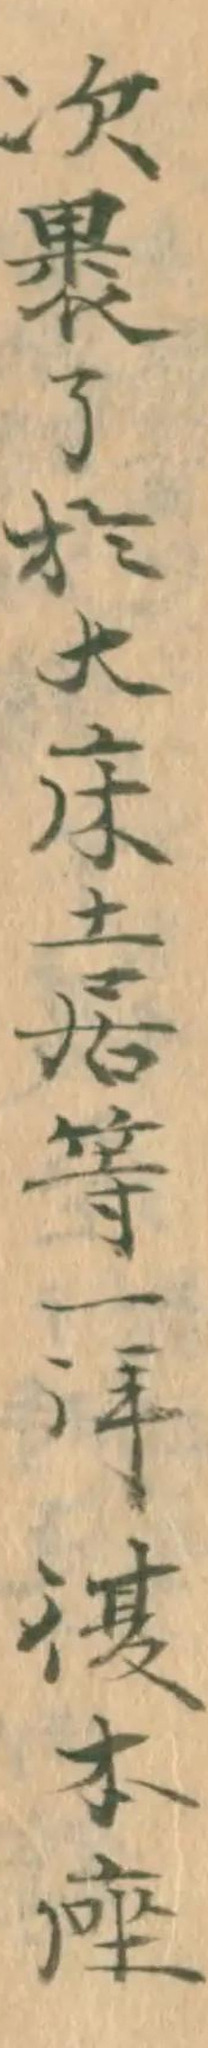次褁了於大床土居等一拝復本座
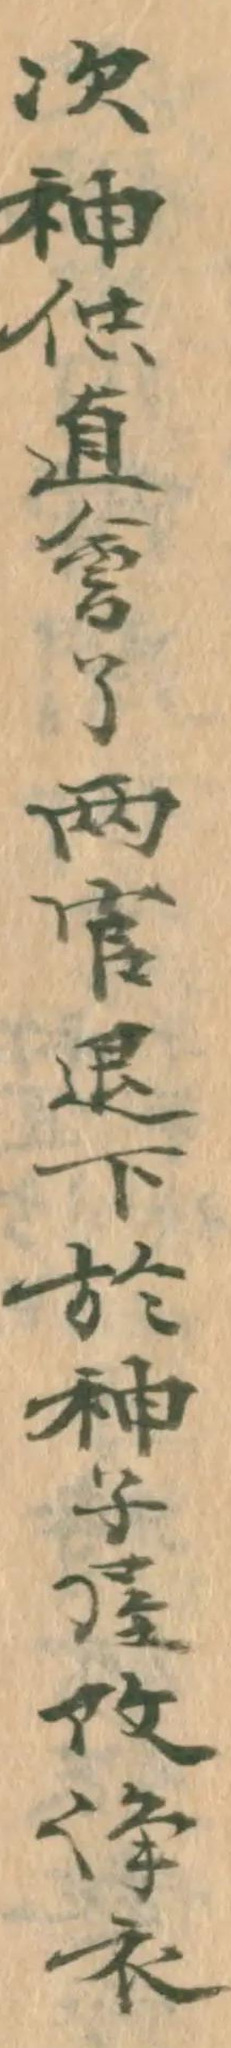次神供直会了両官退下於神子屋改浄衣
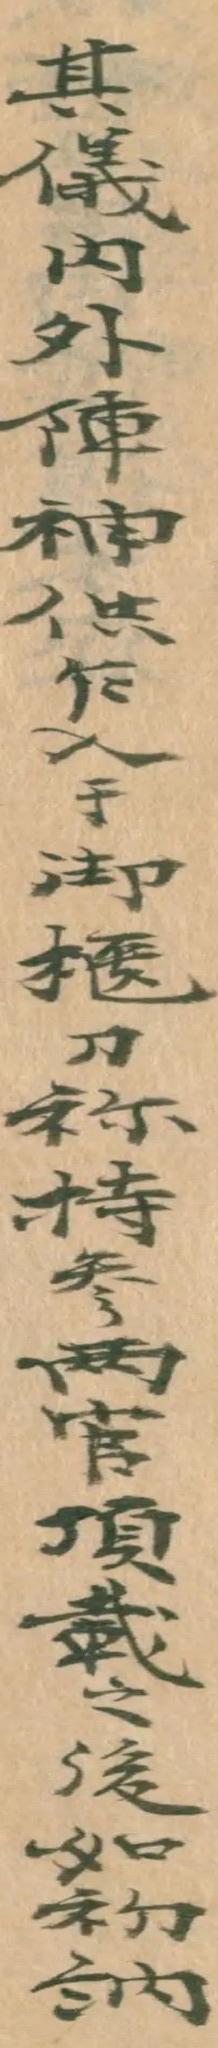其儀内外陣神供乍入于御櫃刀禰持参両官頂戴之後如初納
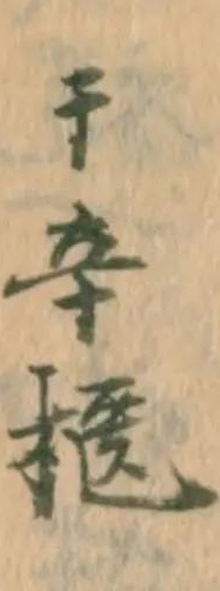于辛櫃
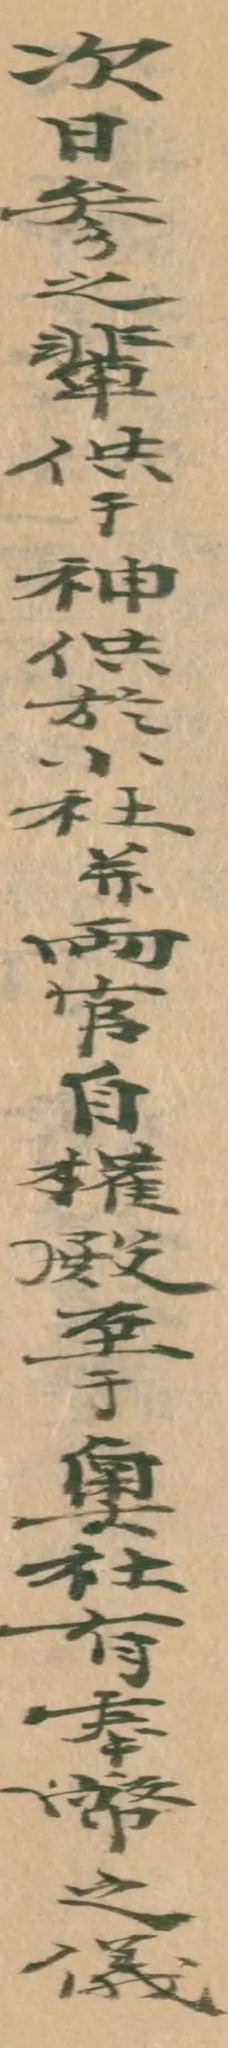次日参之輩供于神供於小社并両官自権殿至于奥社有奉幣之儀
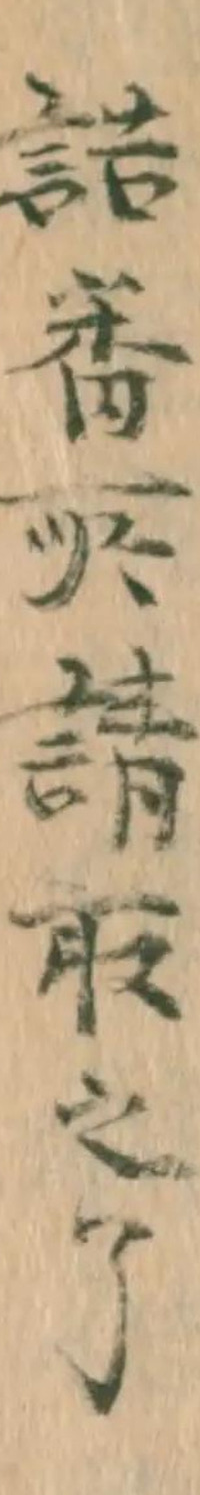詰番所請取之了

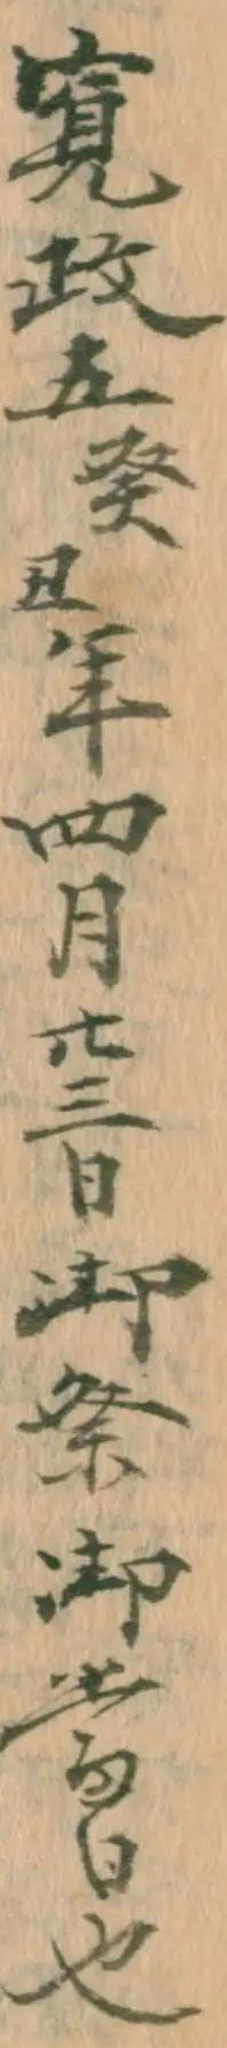寛政五癸丑年四月廿三日御祭御当日也
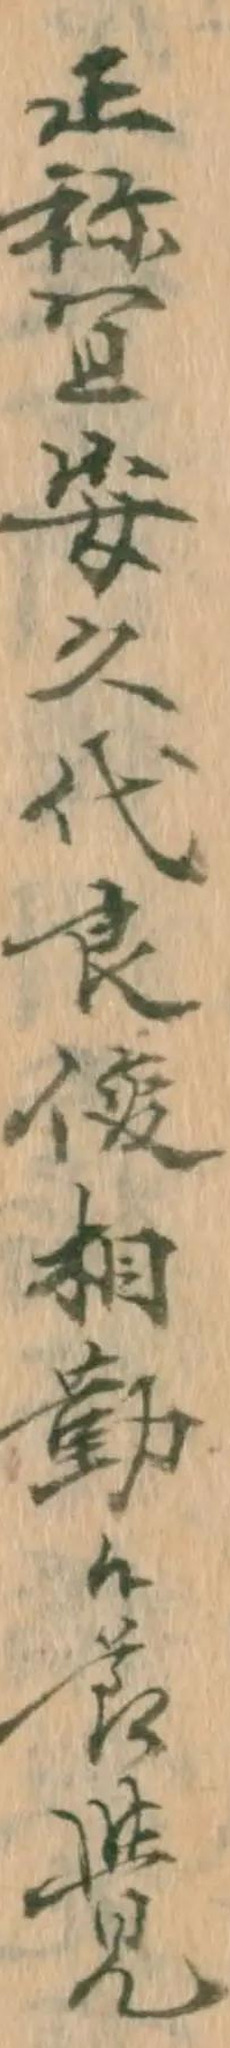正禰宜安久代良俊相勤候節覚
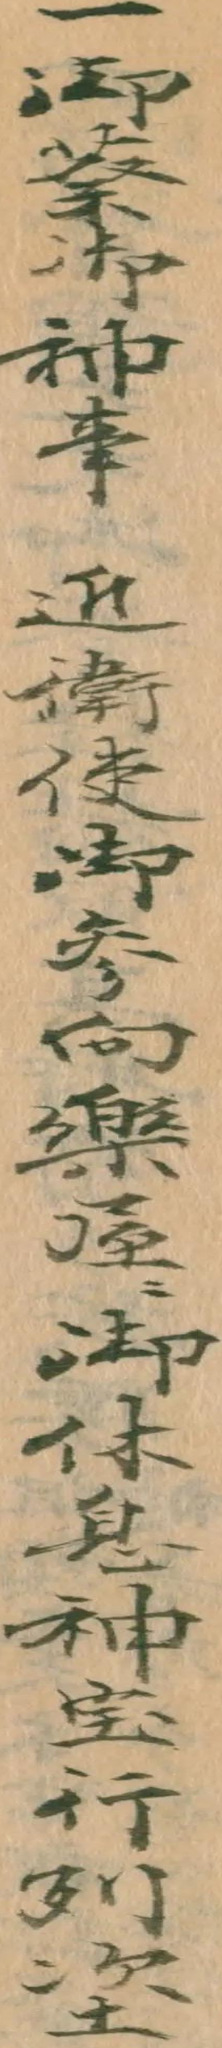一御葵御神事近衛使御参向楽屋ニ御休息神宝行列次土
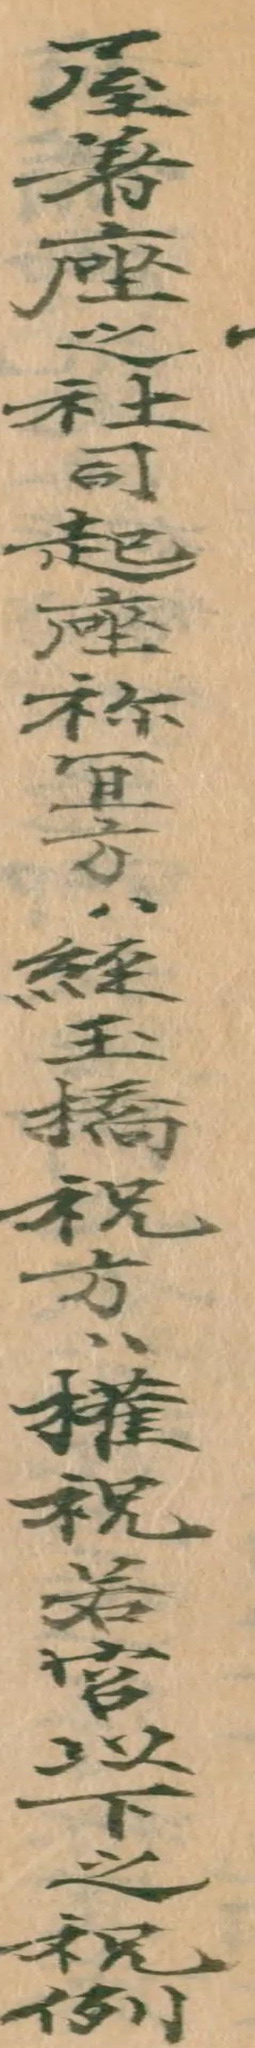屋着座之社司起座禰宜方ハ経玉橋祝方ハ権祝若宮以下之祝例
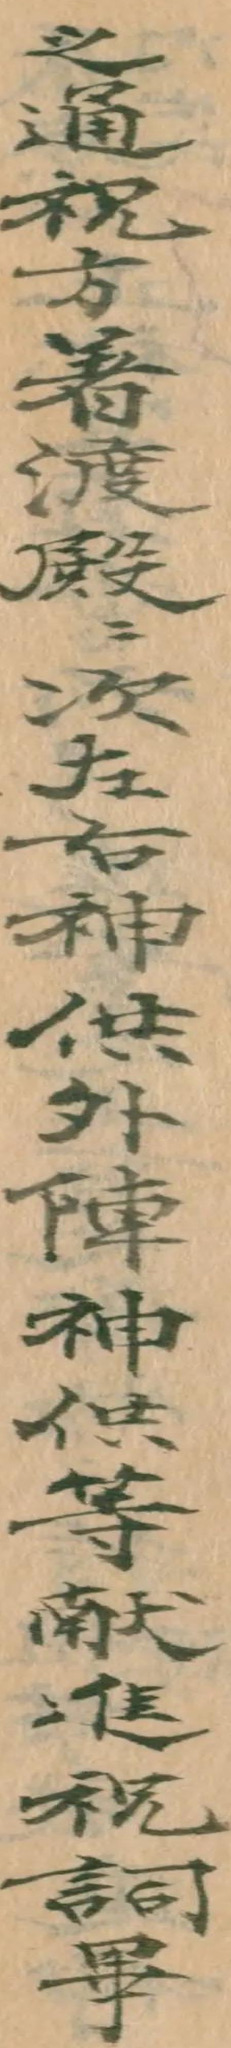之通祝方着渡殿ニ次左右神供外陣神供等献進祝詞畢
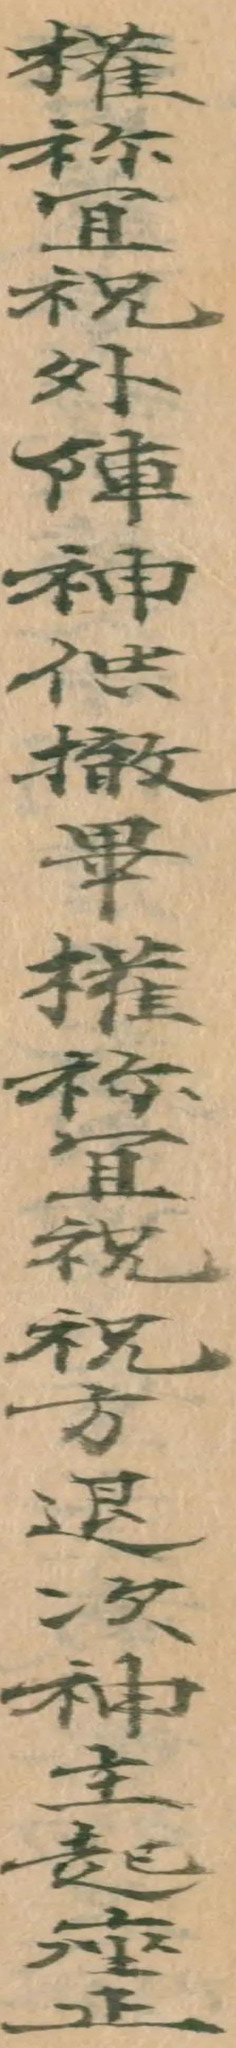権禰宜祝外陣神供撤畢権禰宜祝祝方退次神主起座正
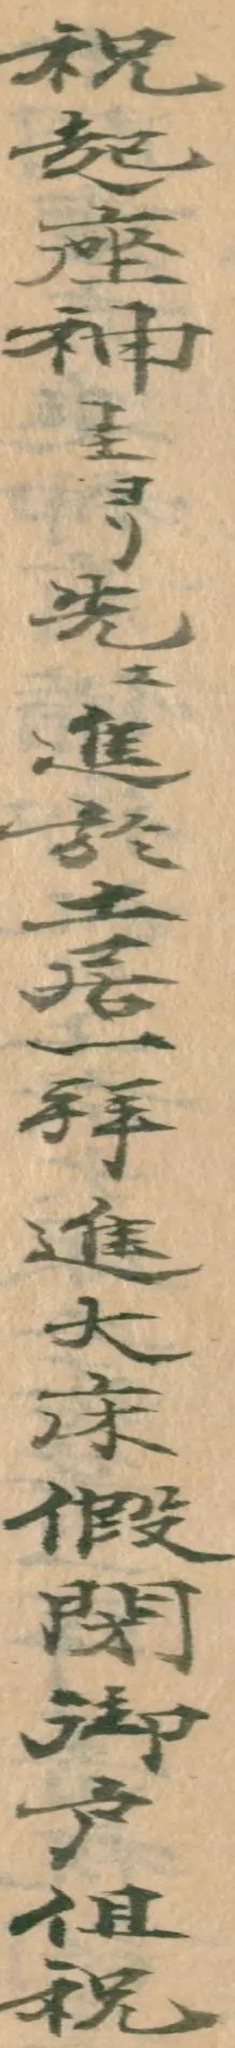祝起座神主ヨリ先エ進於土居一拝進大床仮閉御戸但祝
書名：賀茂社記録. 第5冊
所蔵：国立国会図書館 National Diet Library, JAPAN
